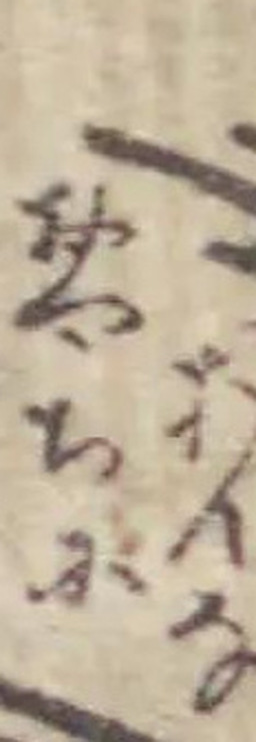おやちに
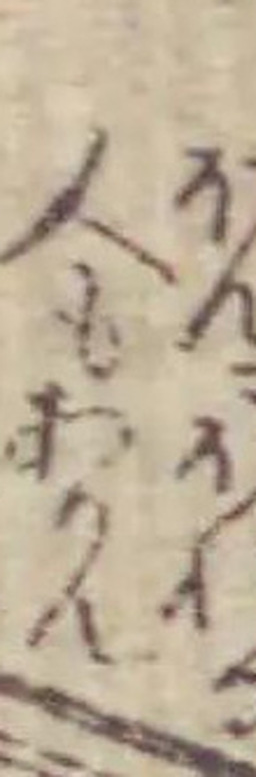人もありん
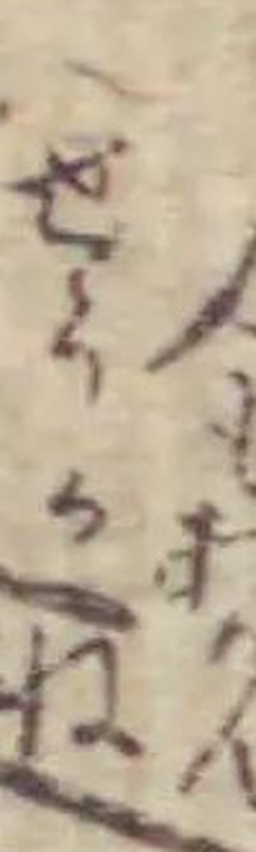せうかね
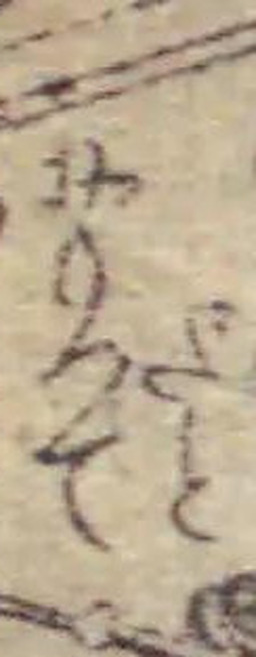おもつて
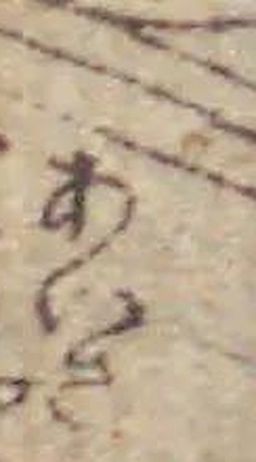あいさ

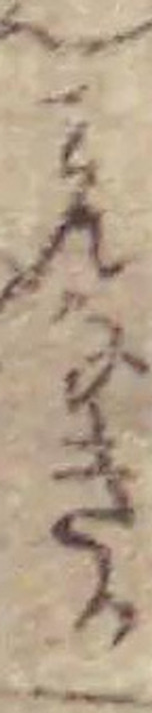みんなきか
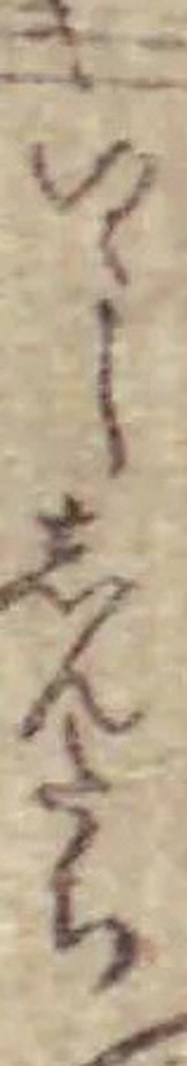いゝししんたち
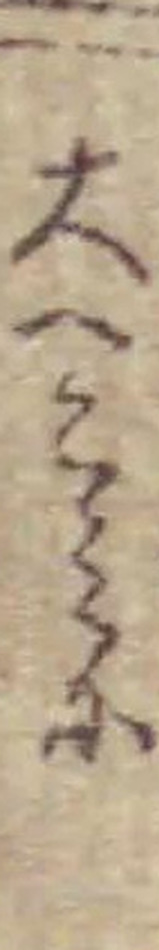大へこみに
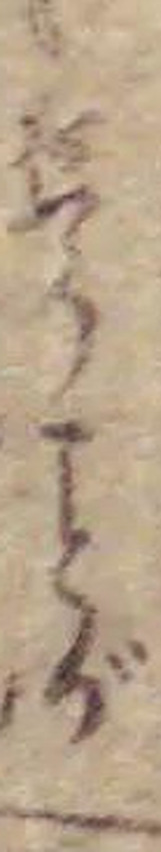せうことが
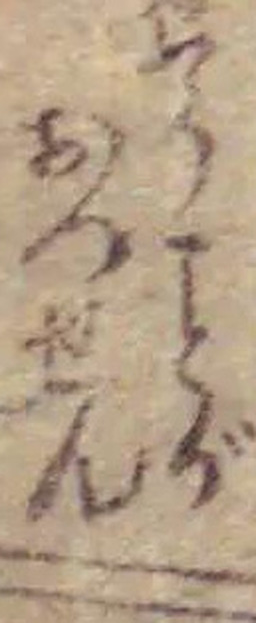おつせん

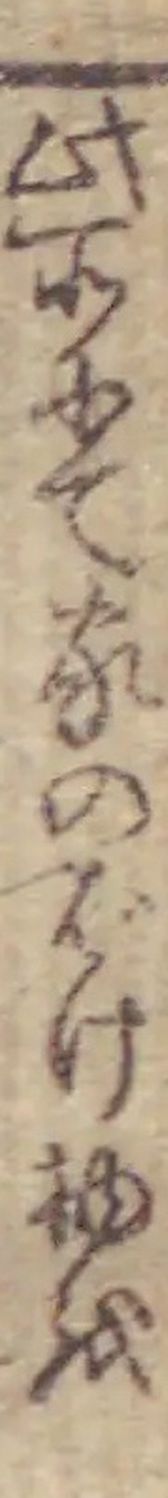此処にて家のばけ物を
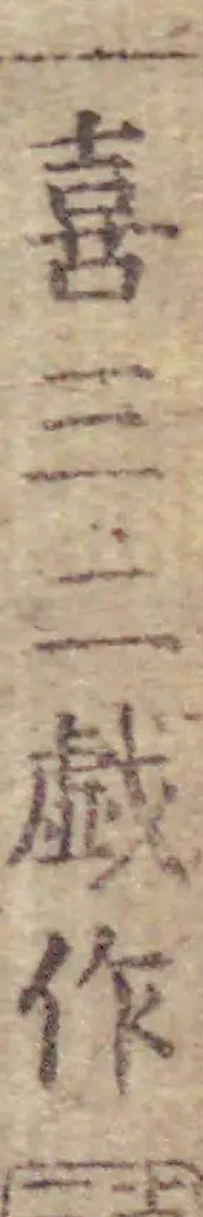喜三二戯作
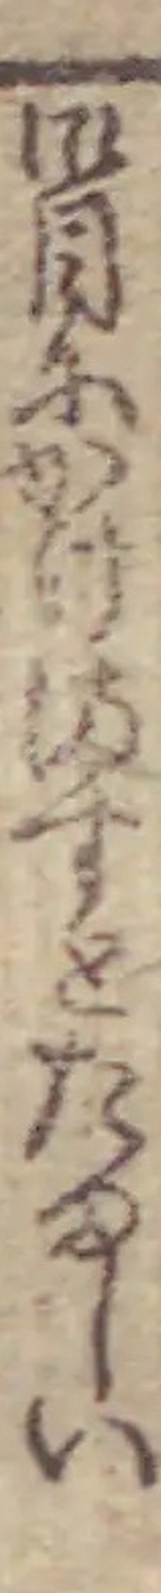御目にかけますとたましい
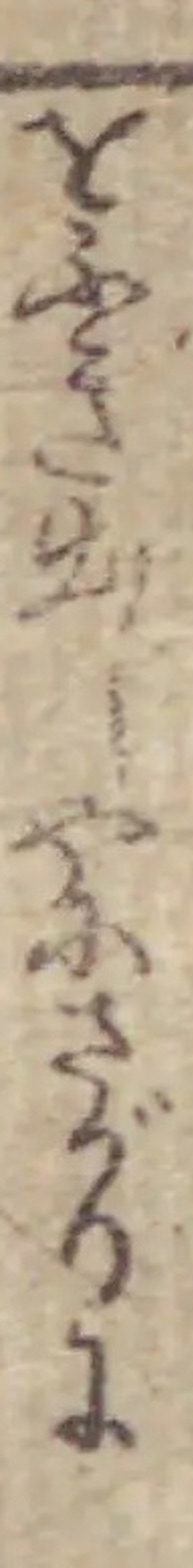をふき出しやにさがりに
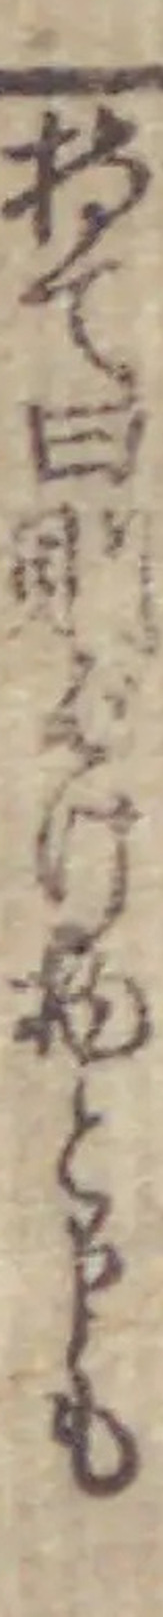持て曰則ばけ物と申も
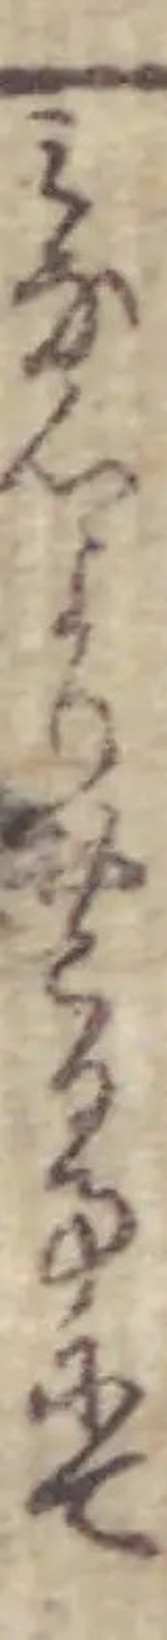みな心よりおこる事にて
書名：亀山人家妖 3巻
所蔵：国立国会図書館 National Diet Library, JAPAN
